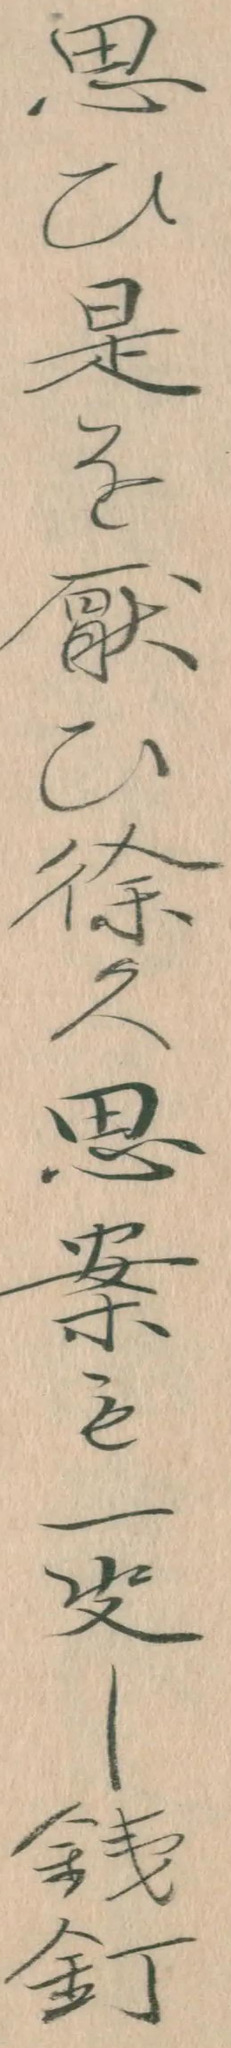思ひ是を厭ひ徐く思案も一決し銕釘
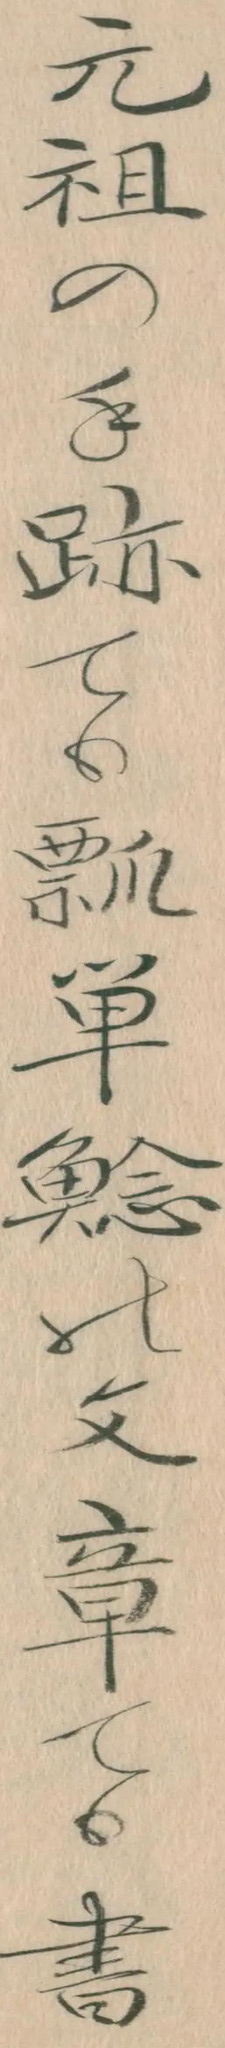元祖の手跡ても瓢単鯰の文章ても書
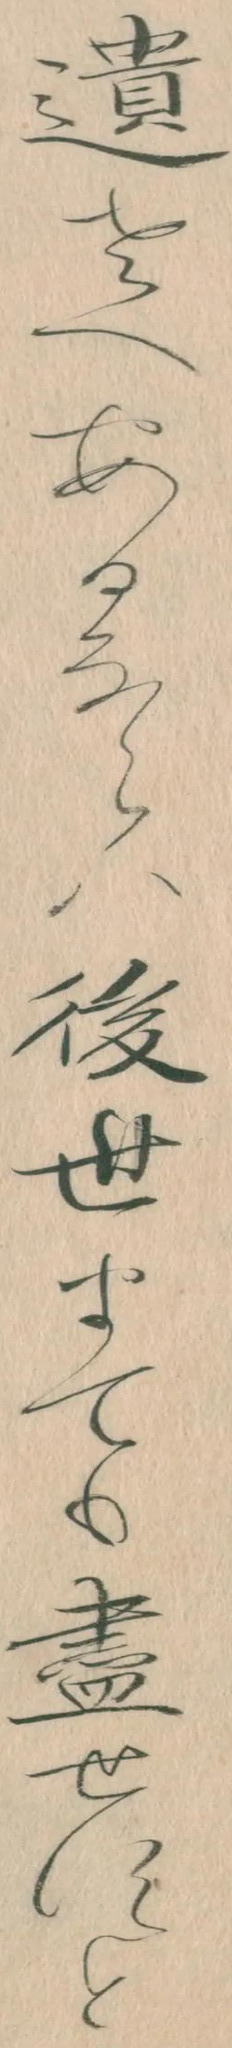遺さへあるならは後世まても尽せすと
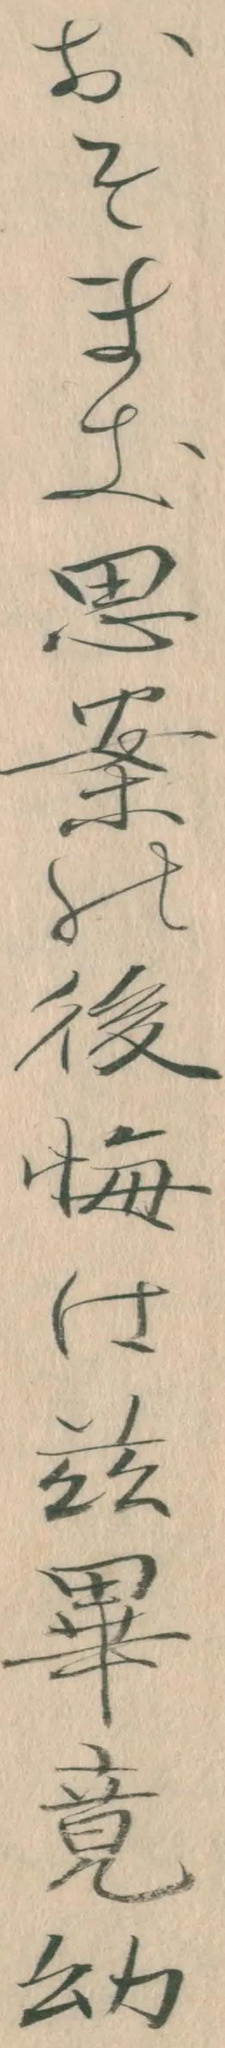おそまき思案の後悔は茲畢竟幼
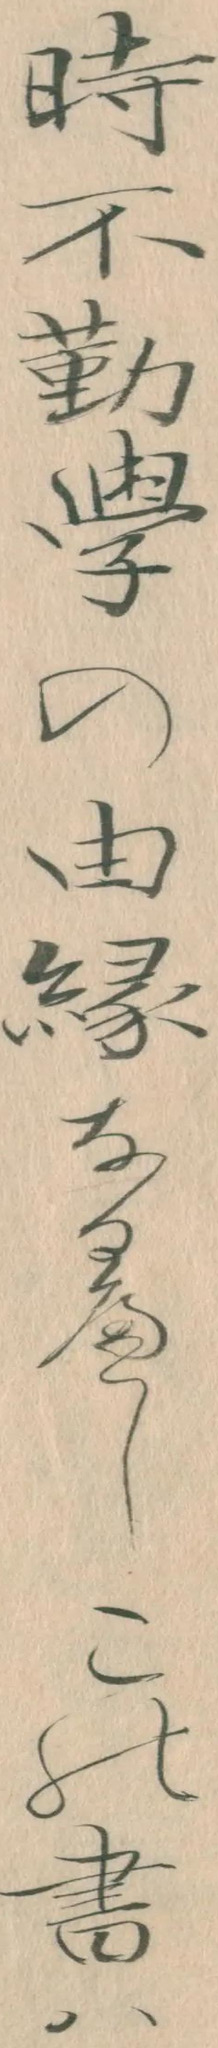時不勤学の由縁なるへしこの書は
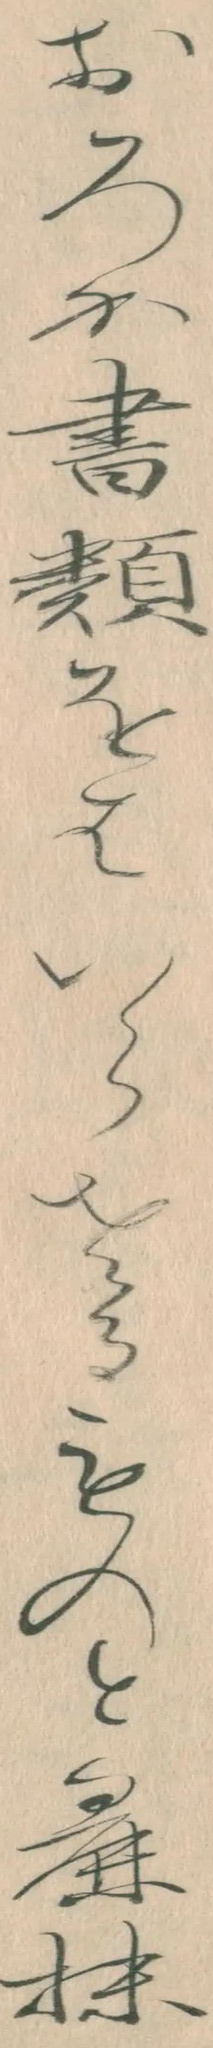おろか書類をはいらさるものと麁抹

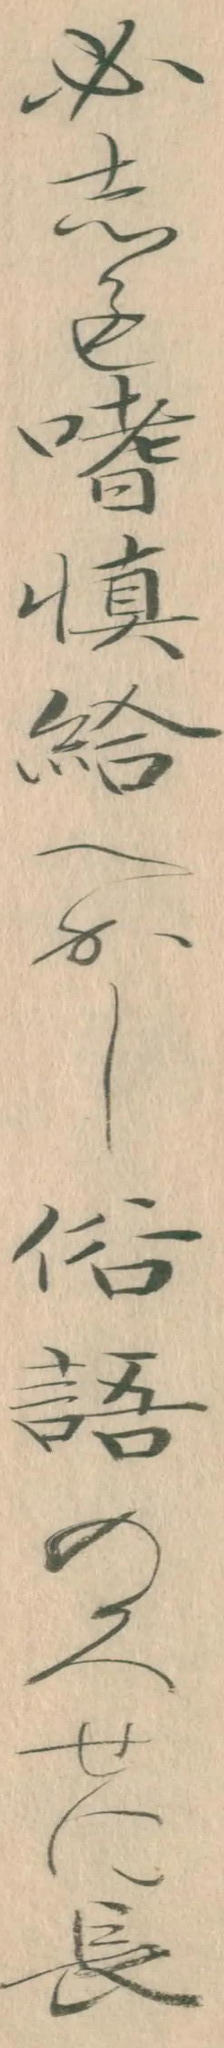必しも嗜慎給へかし俗語のくせに長
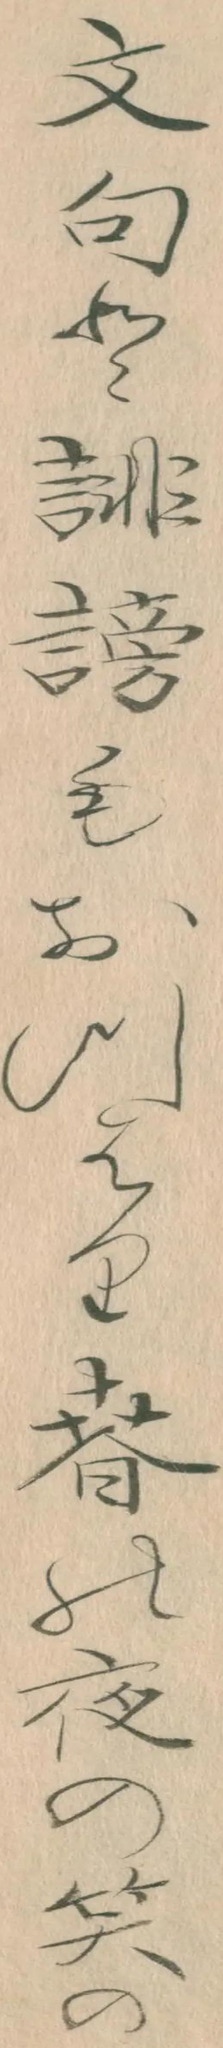文句と誹謗もおつはり春の夜の笑の
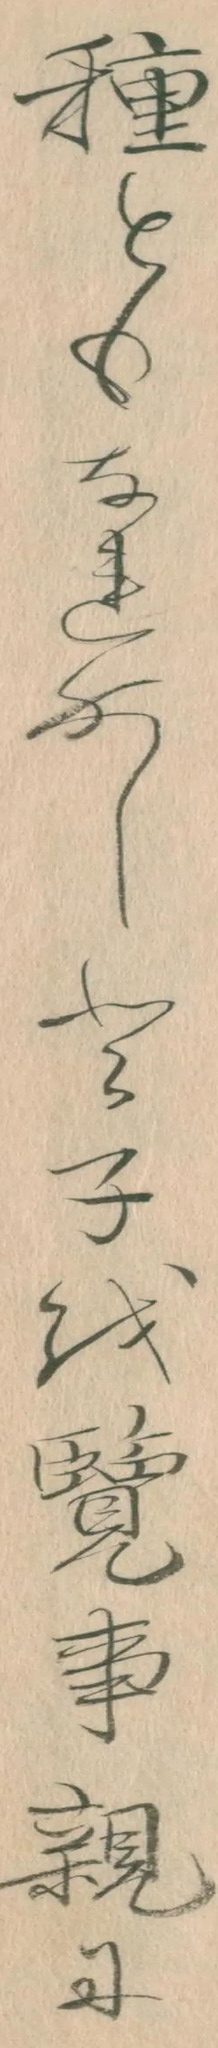種ともなれかしと子を覧事親に
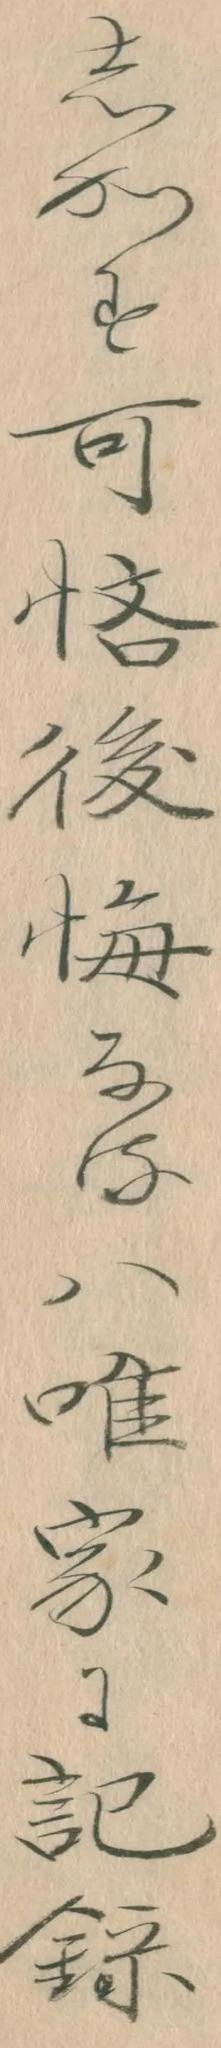しかす可悋後悔なるは唯家に記録
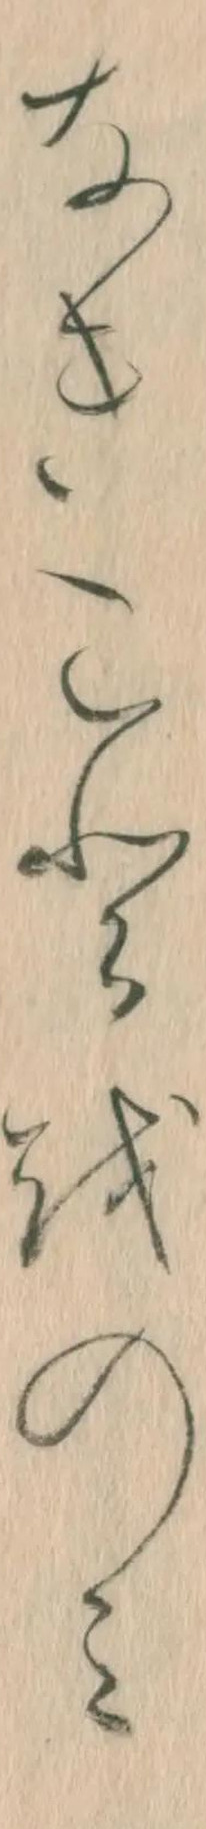なきことをのみ
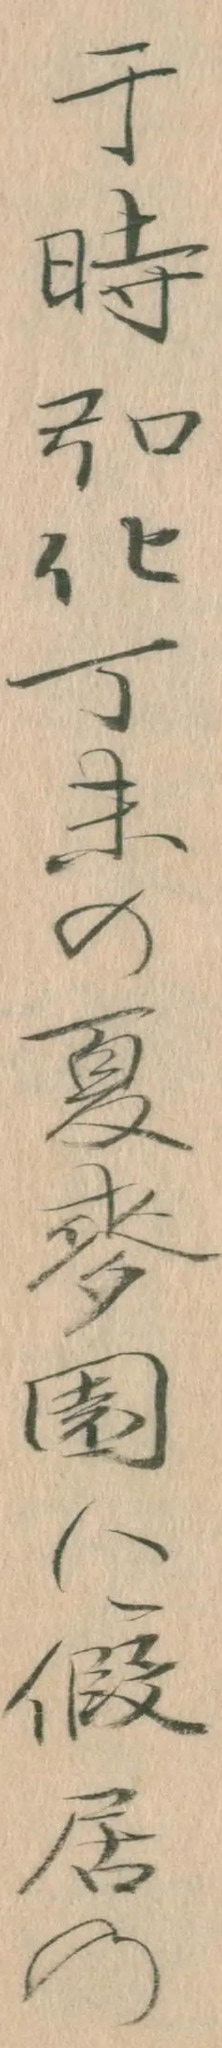于時弘化丁未の夏麦園に仮居の
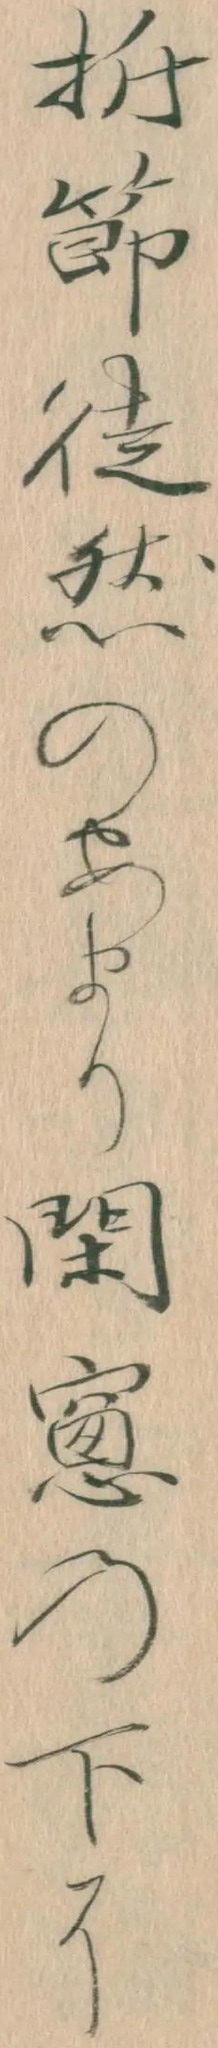折節徒然のあまり閑窓の下に
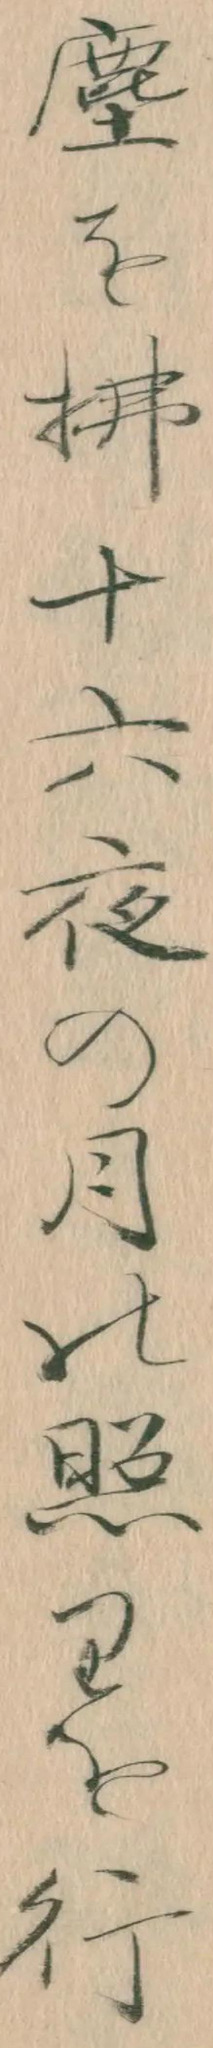塵を払十六夜の月の照りを行
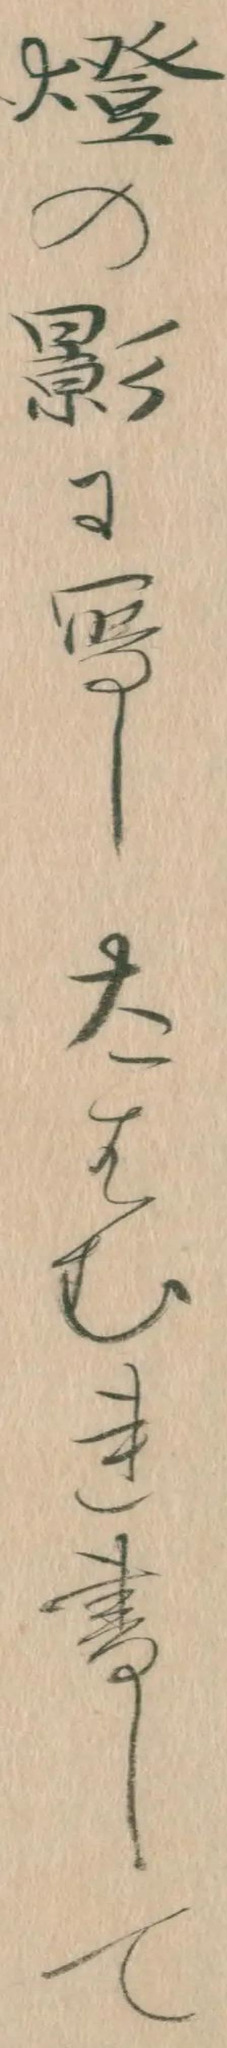灯の影に写したはむれ書して
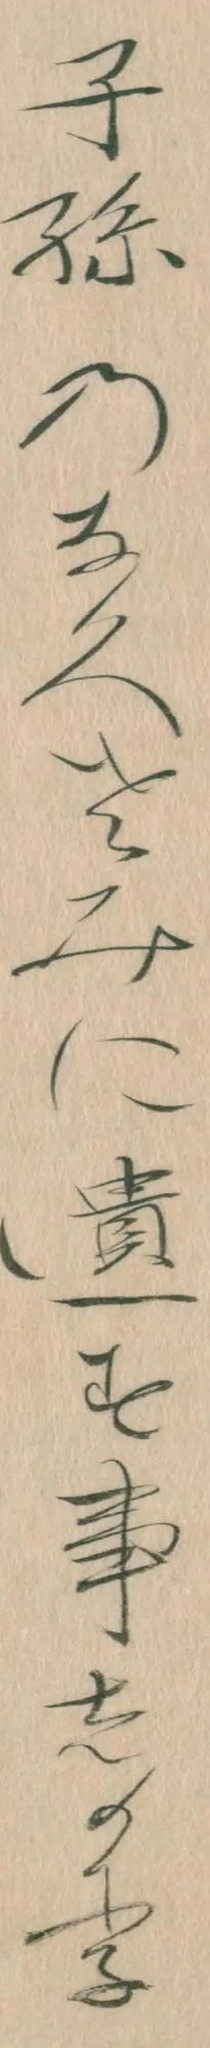子孫のなくさみに遺す事しかり
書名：俗語之種. [1]
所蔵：国立国会図書館 National Diet Library, JAPAN
